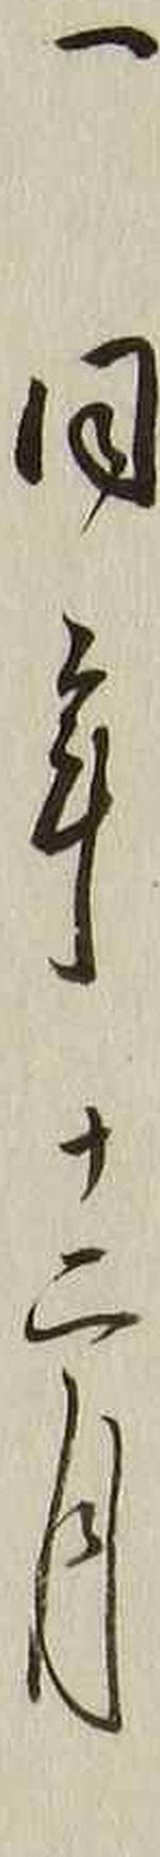一同年十二月
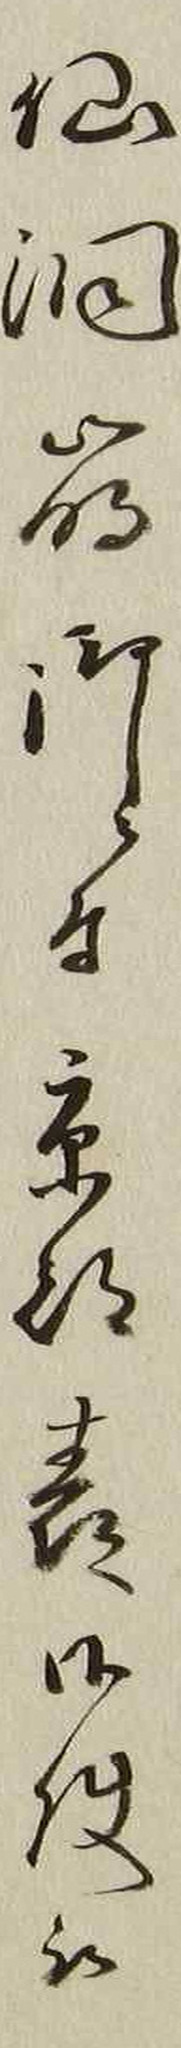仙洞崩御に付京都表御使被
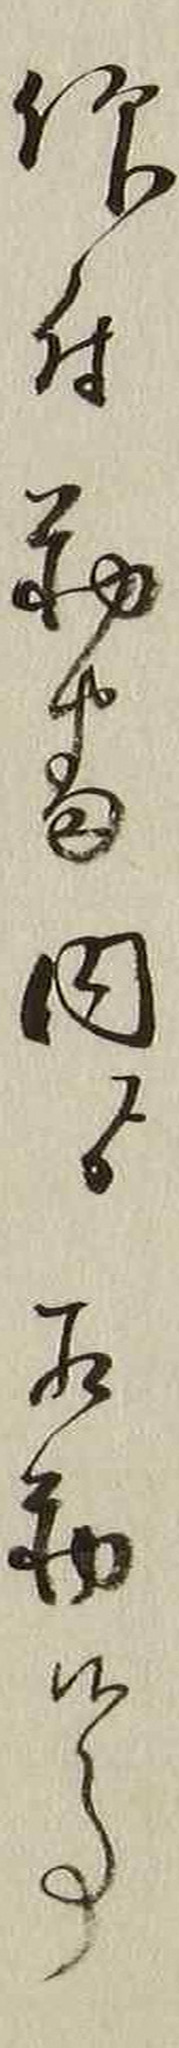仰付勤番内ゟ相勤候事
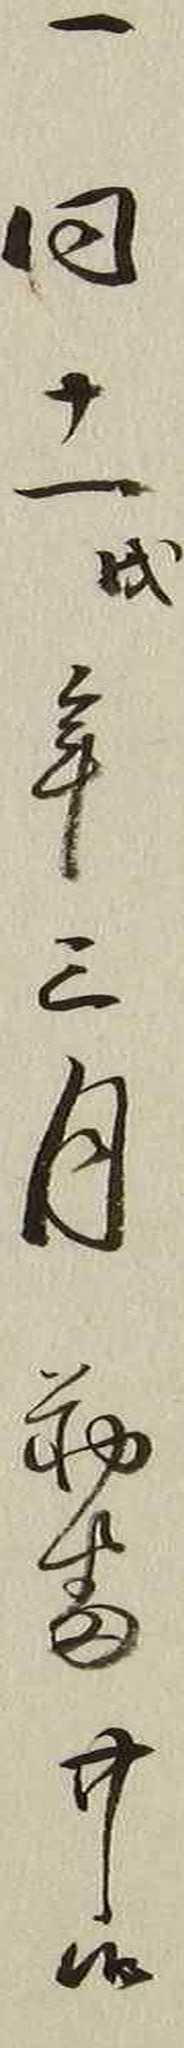一同十一成年三月勤番中御
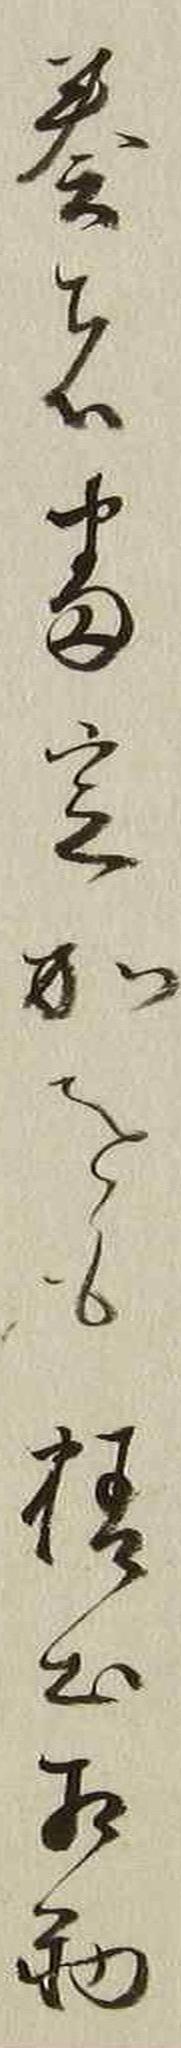奏者番定加をも精出相勤
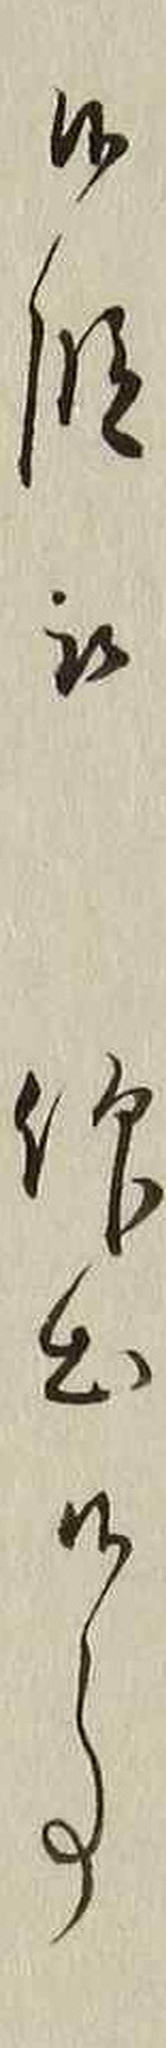候段被仰出候事
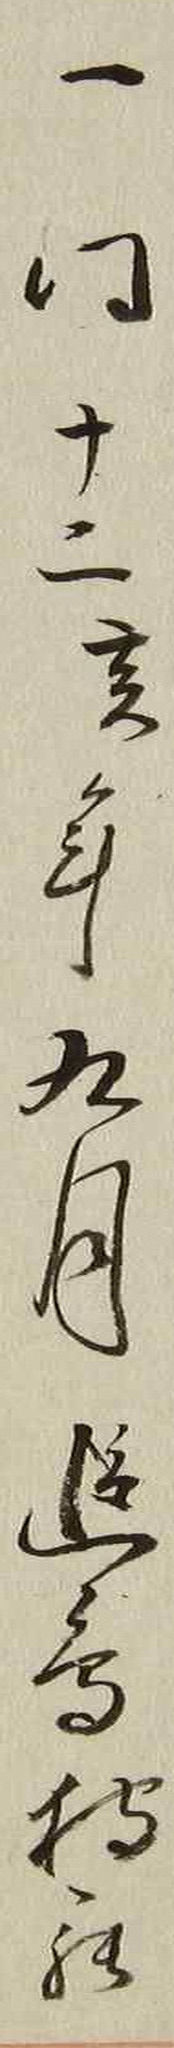一同十二亥年九月追鳥狩罷
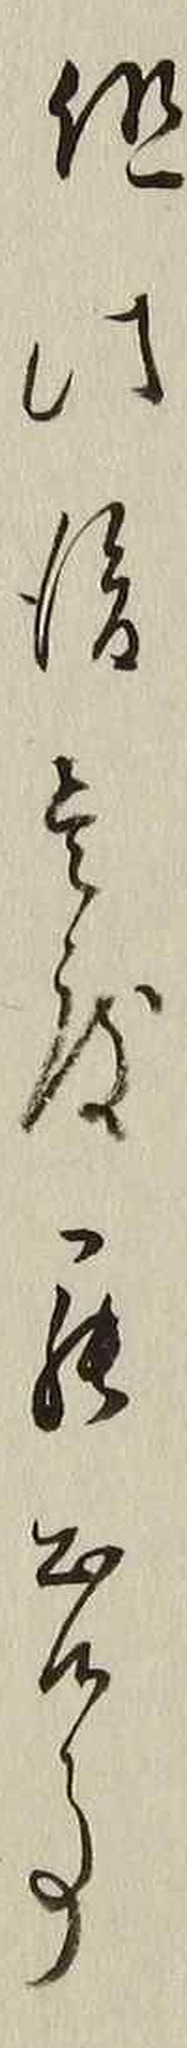但此後壱度罷出候事
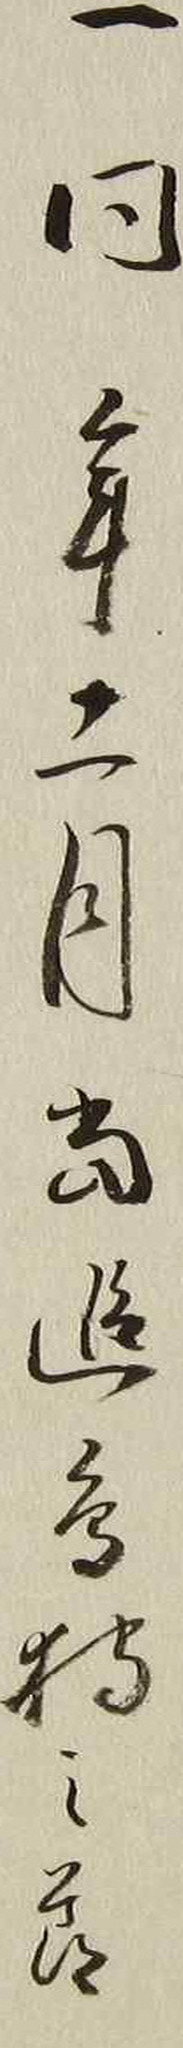一同年十一月当追鳥狩之節
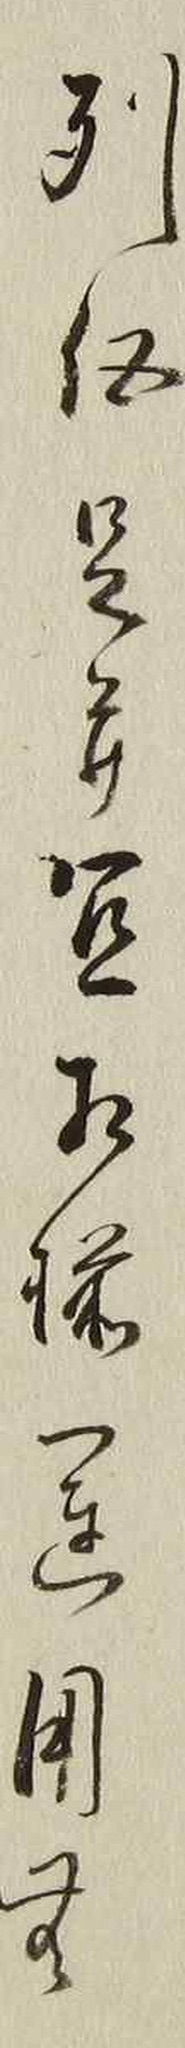列伍足并宜相揃運用無
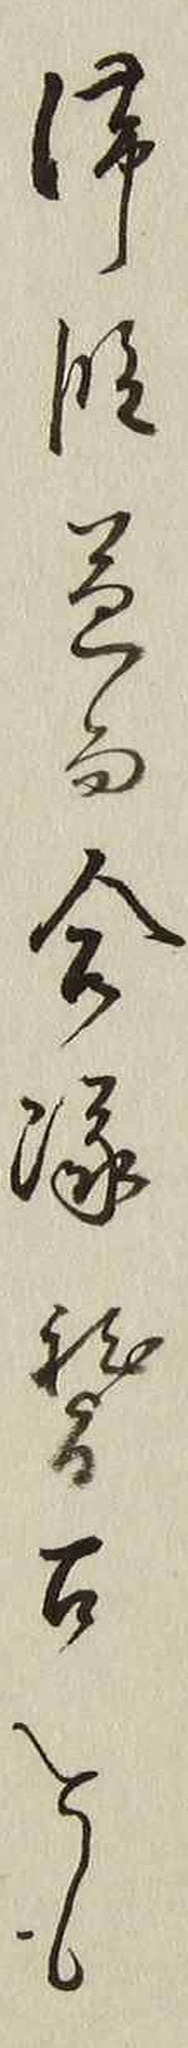滞段兼而合隊稽古をも
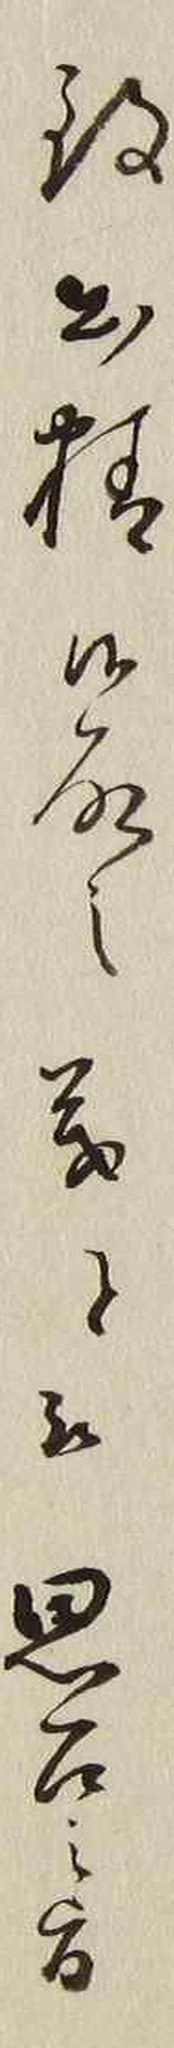致出精候故之義と被思召之旨
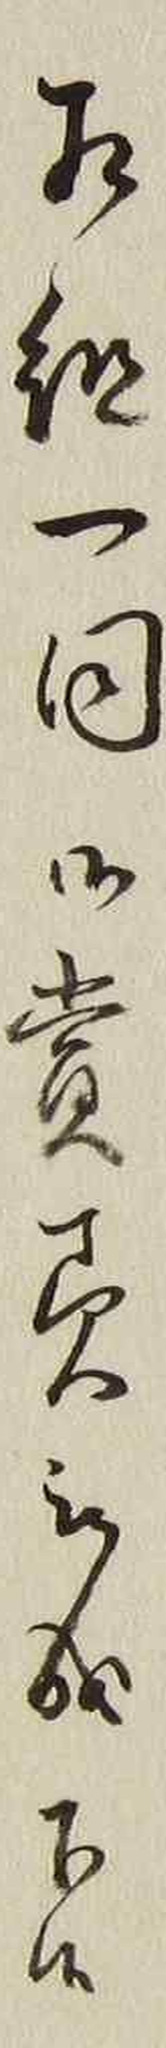相組一同御賞美被成下候
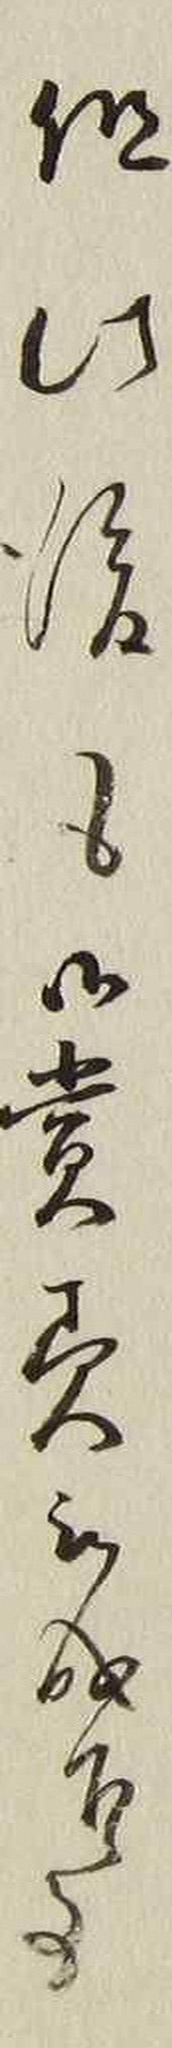但此後も御賞美被成下候事
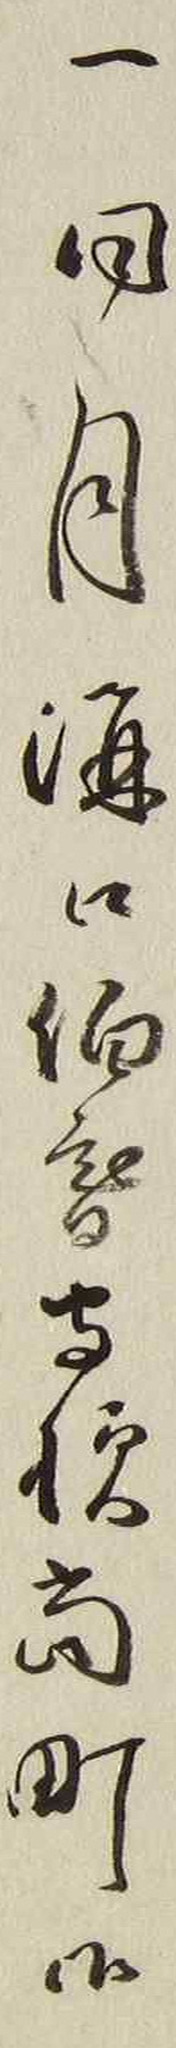一同月溝口伯耆守様当町御
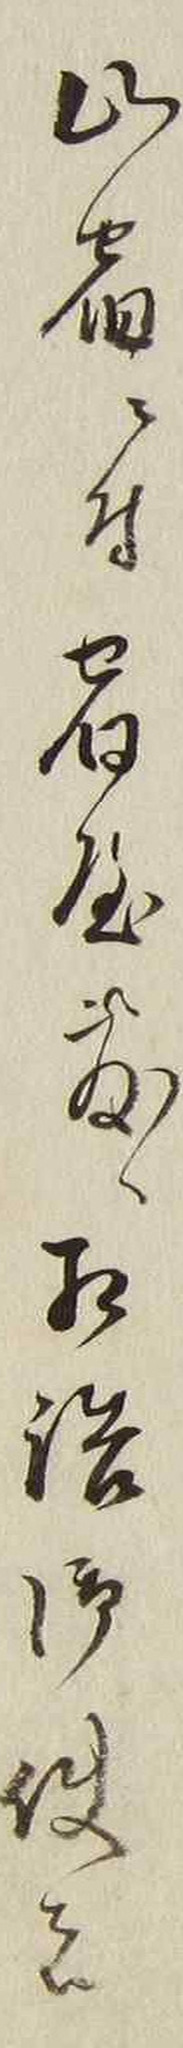投宿に付宿屋敷へ相詰御使者
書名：諸士系譜　巻之159　な之部1
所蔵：会津若松市立会津図書館
